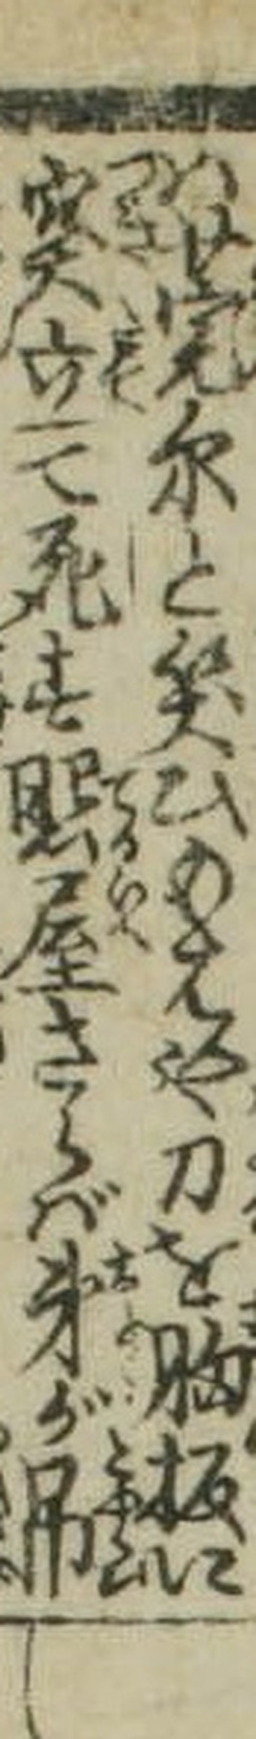突立て死す照屋さらば弟が弔
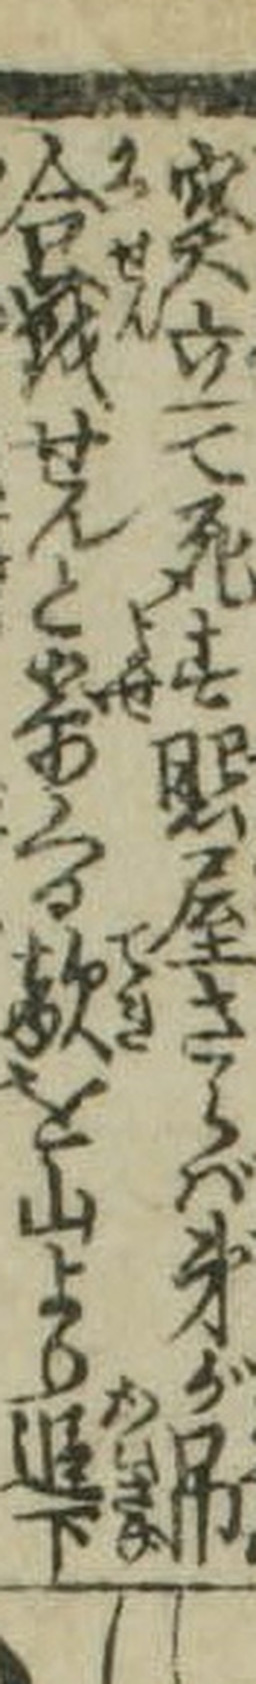合戦せんと寄くる敵を山より追下
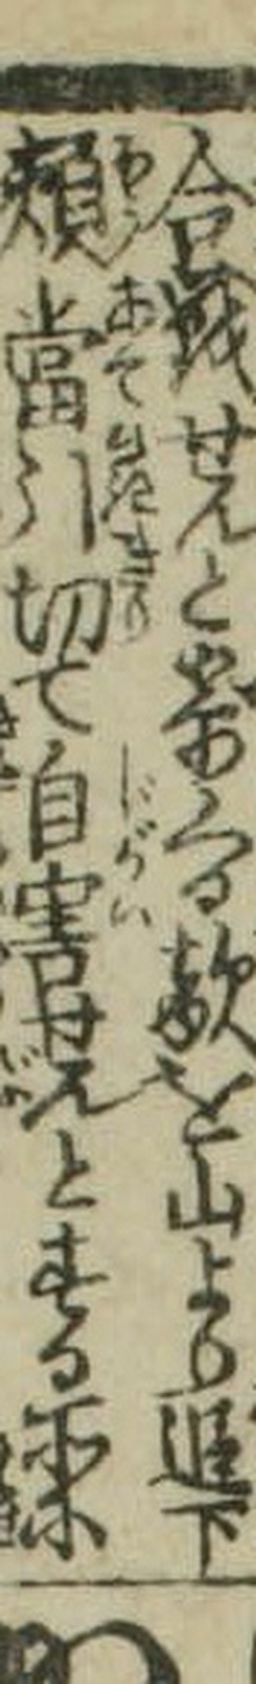頬当引切て自害せんとする所に
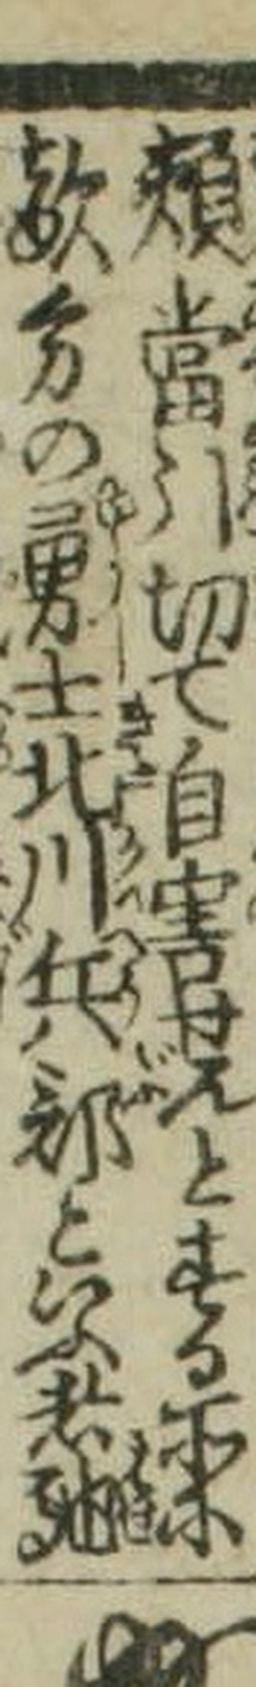敵方の勇士北川兵部といふ者馳
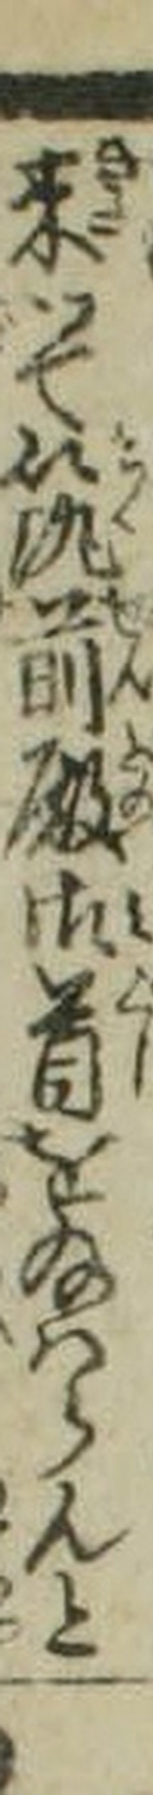来つて筑前殿御首を給はらんと
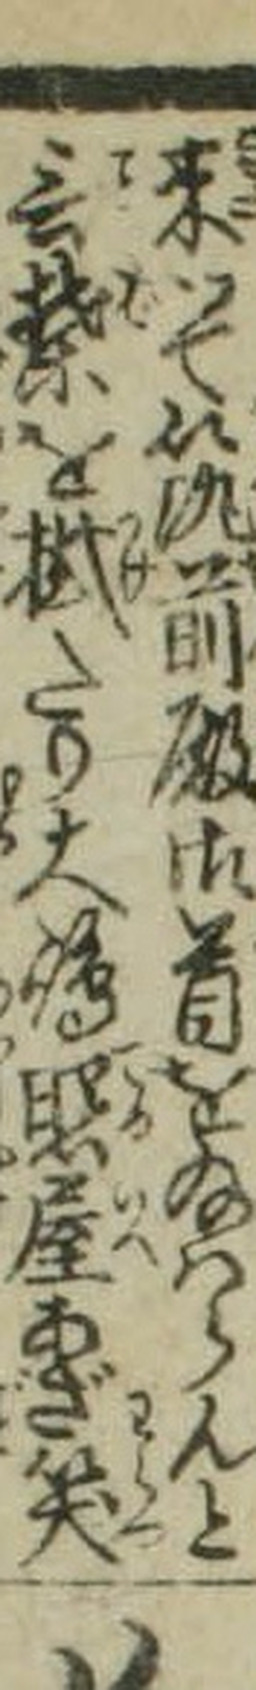言葉を掛たり大嶋照屋あざ笑
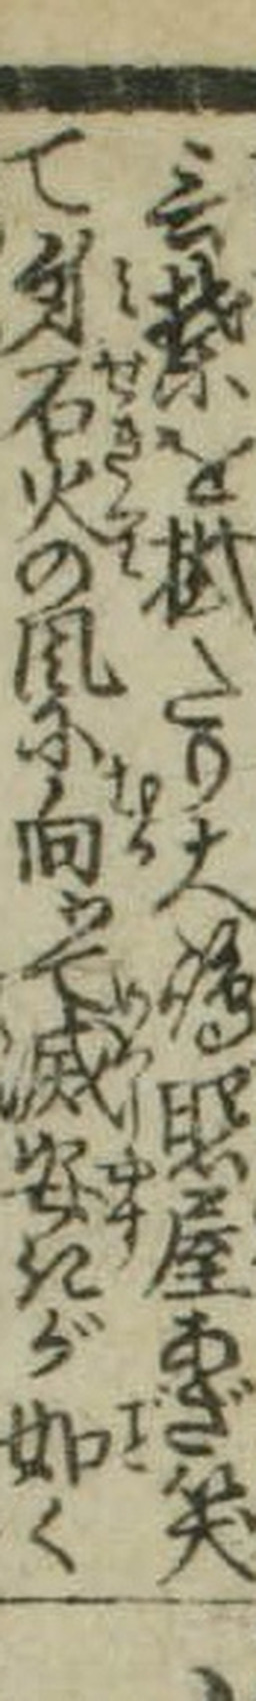て身石火の風に向つて滅安きが如く
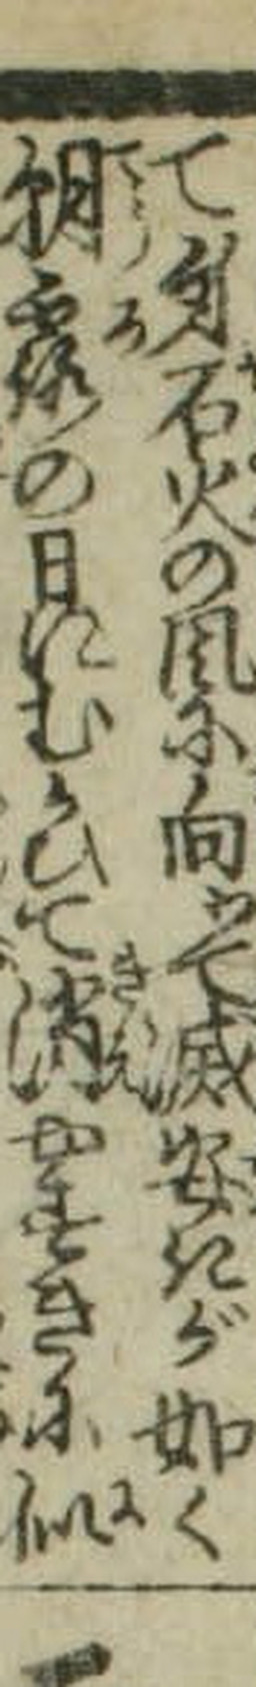朝露の日にむかひて消やすきに似
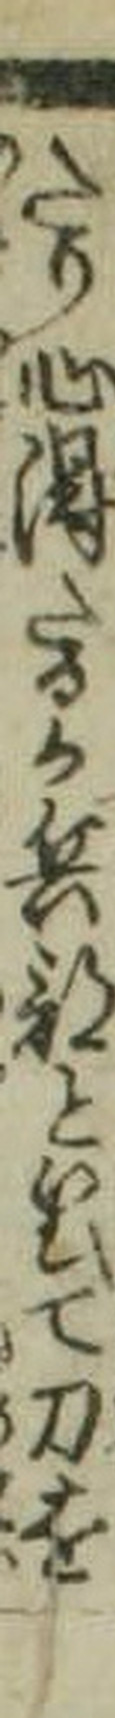たり心得たるか兵部といひて刀を
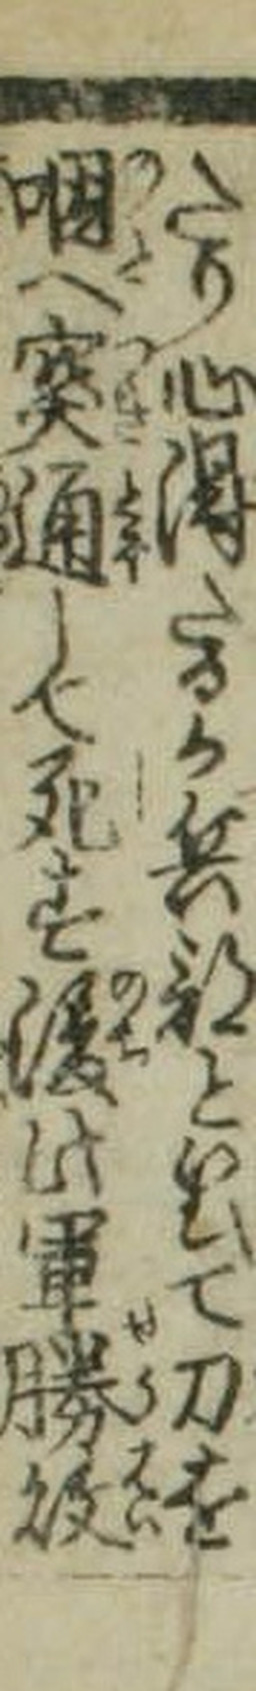咽へ突通して死す後此軍勝敗
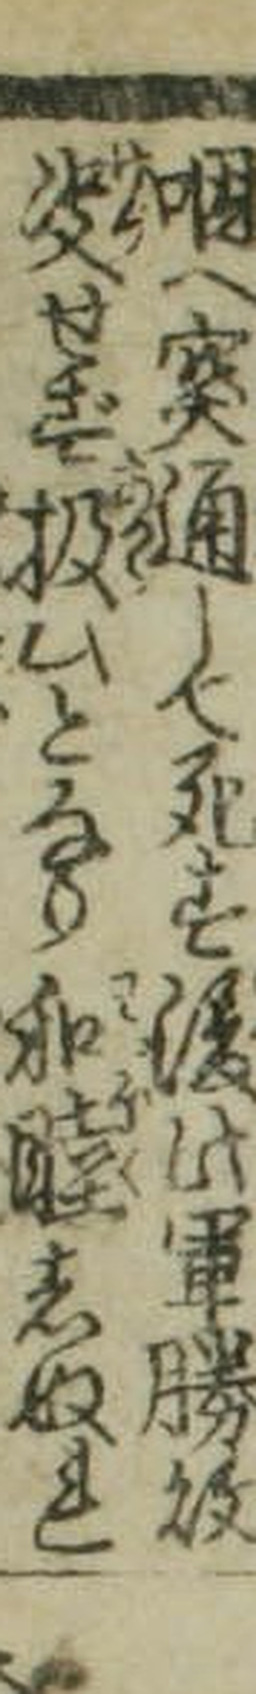決せず扱ひとなり和睦しぬれ
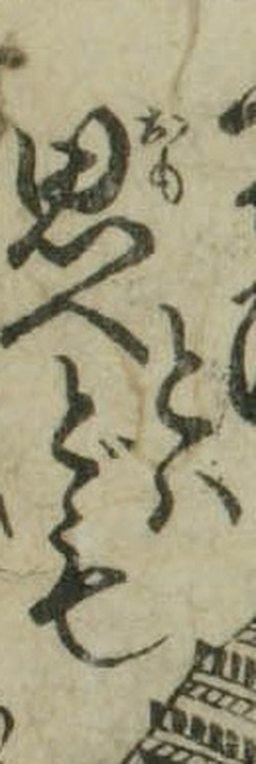思へども
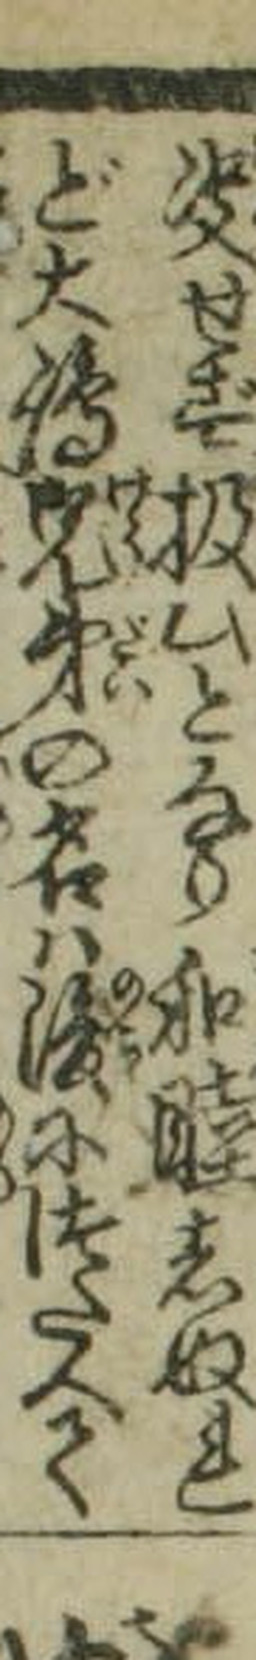ど大嶋兄弟の名は後につたへて
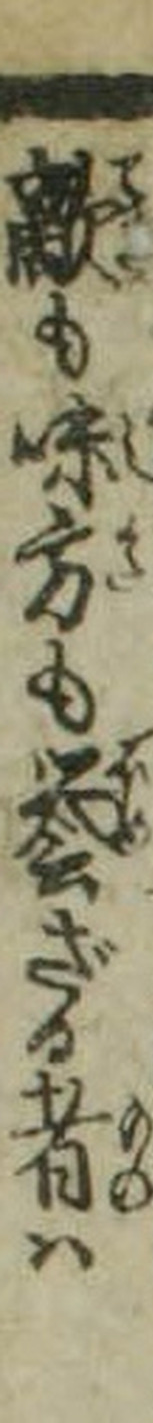敵も味方も誉ざる者は
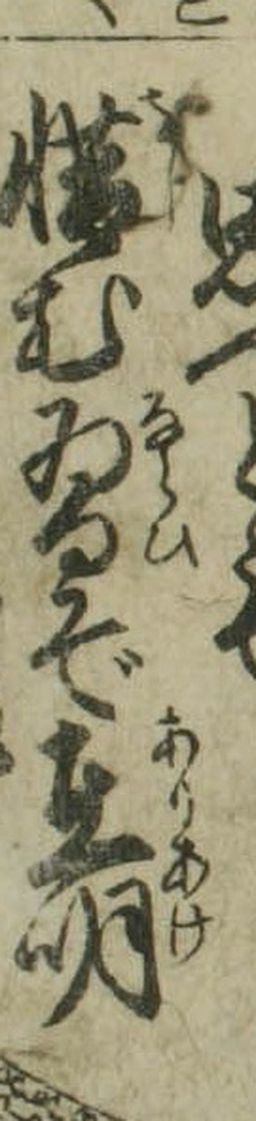惜む習ぞ在明
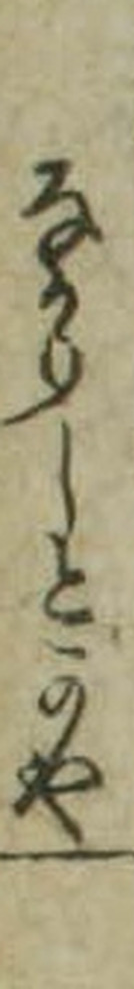なかりしとかや
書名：續英雄百人一首
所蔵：東京学芸大学附属図書館
